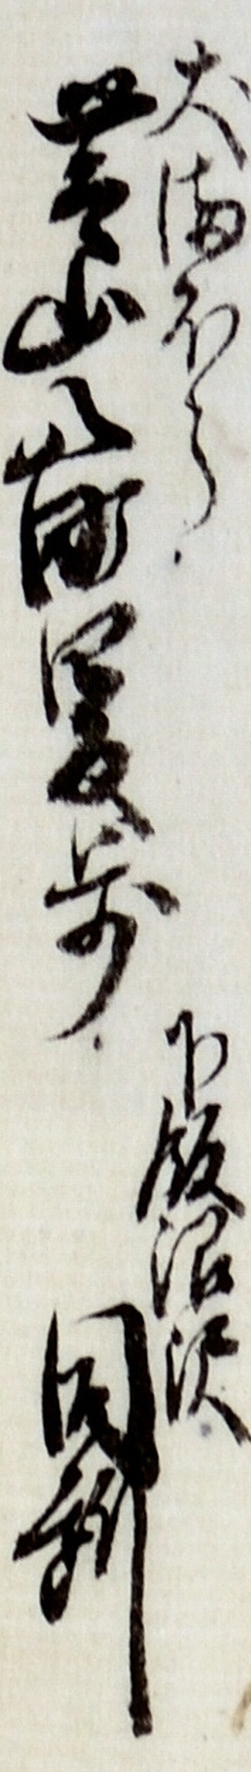芝山八町四反歩同断
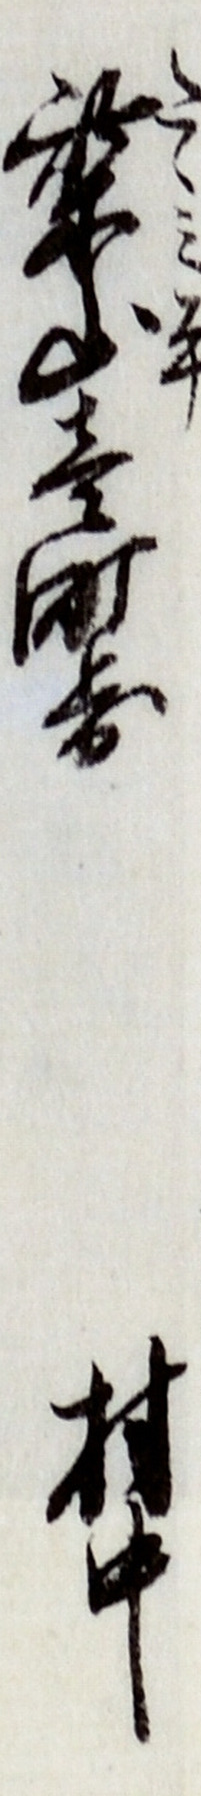柴山壱町歩村中
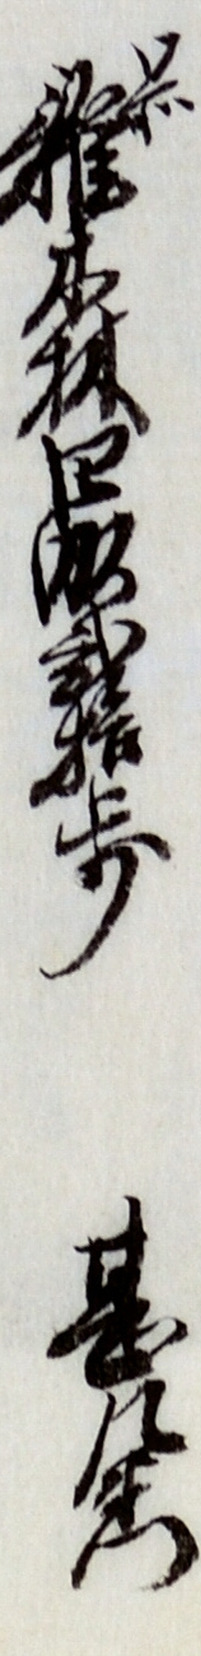雑木林四畝弐拾歩甚左衛門

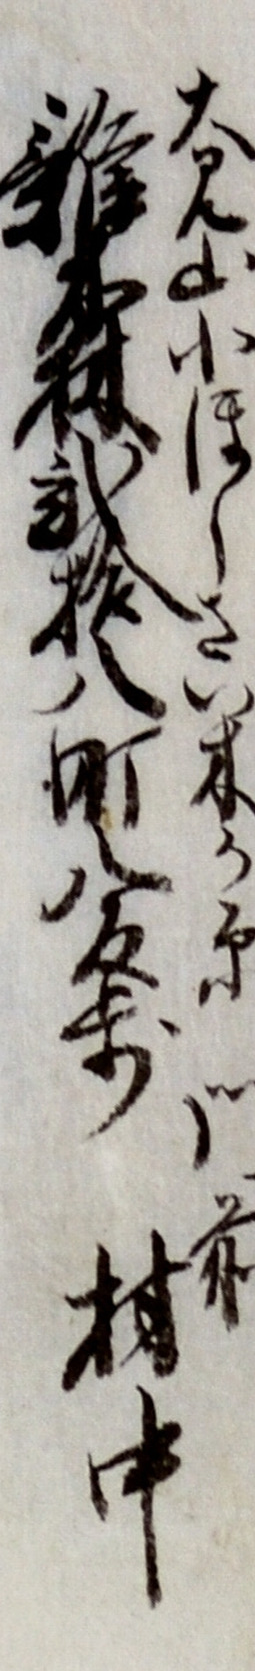雑木林弐拾八町八反歩村中
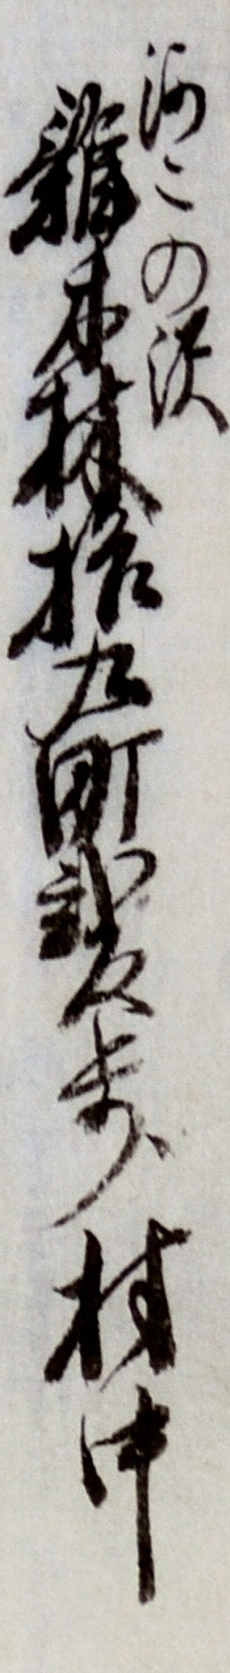雑木林拾九町弐反歩村中
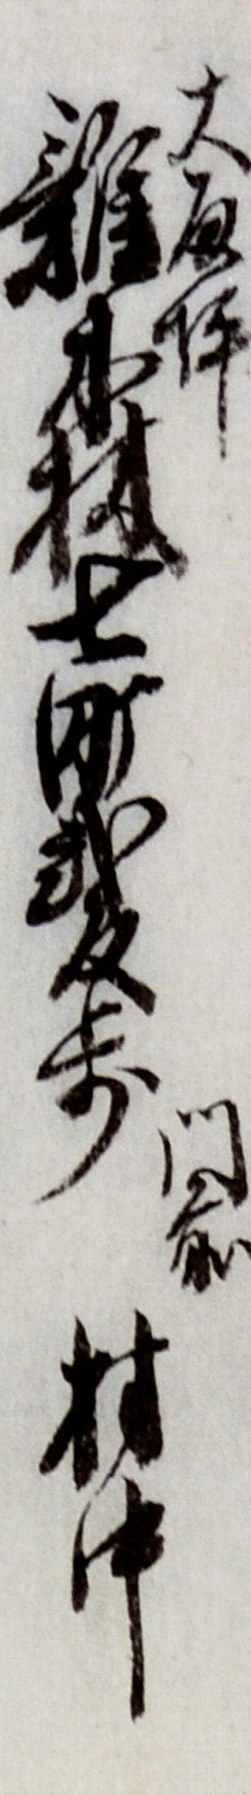雑木林七町弐反歩村中
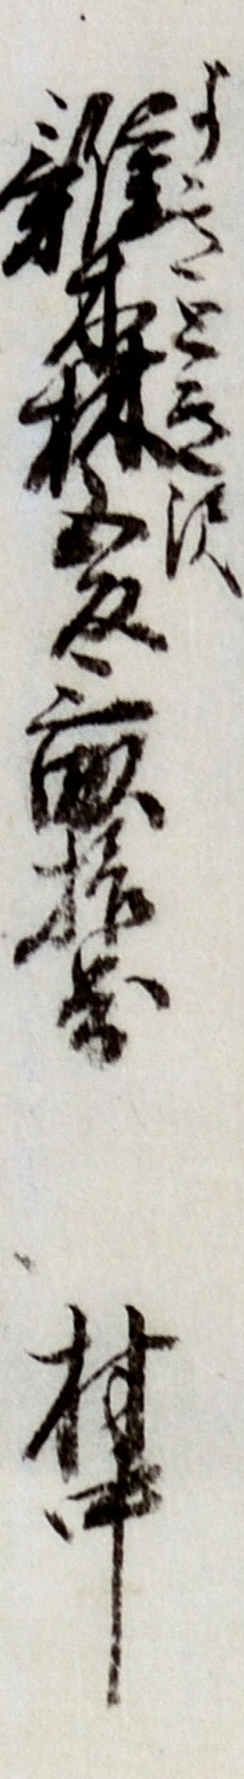雑木林五反三畝拾歩村中
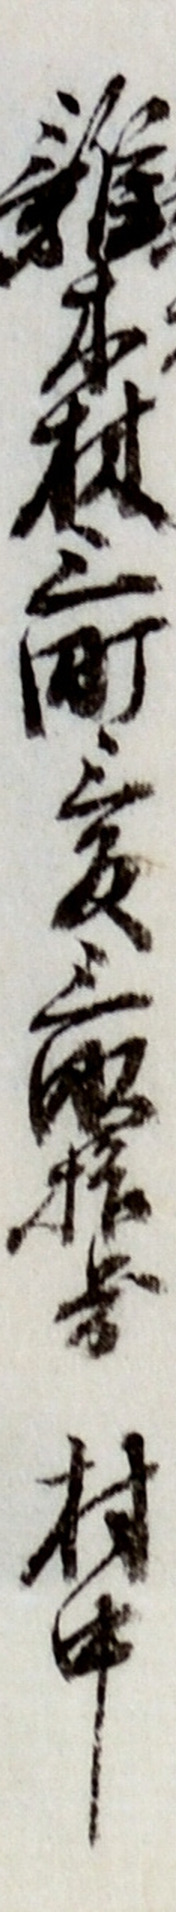雑木林三町三反三畝拾歩村中
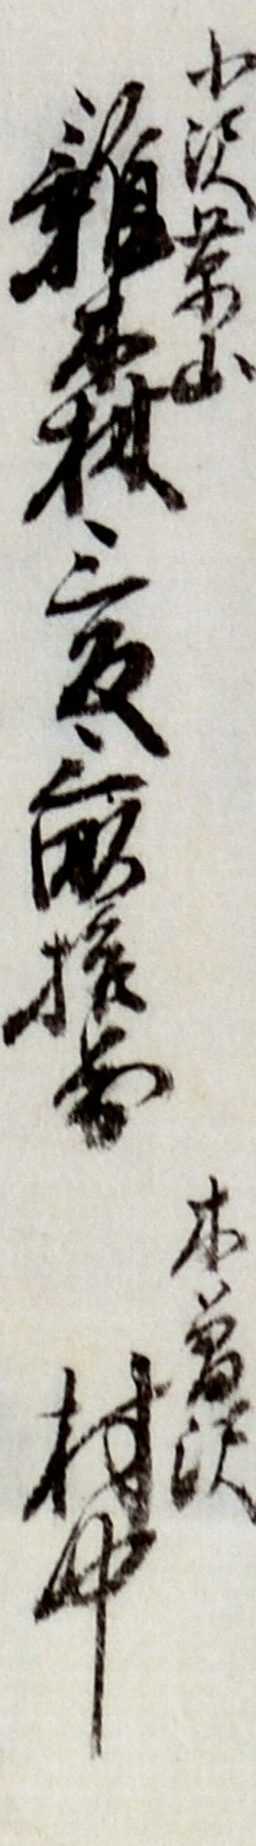雑木林三反三畝拾歩村中
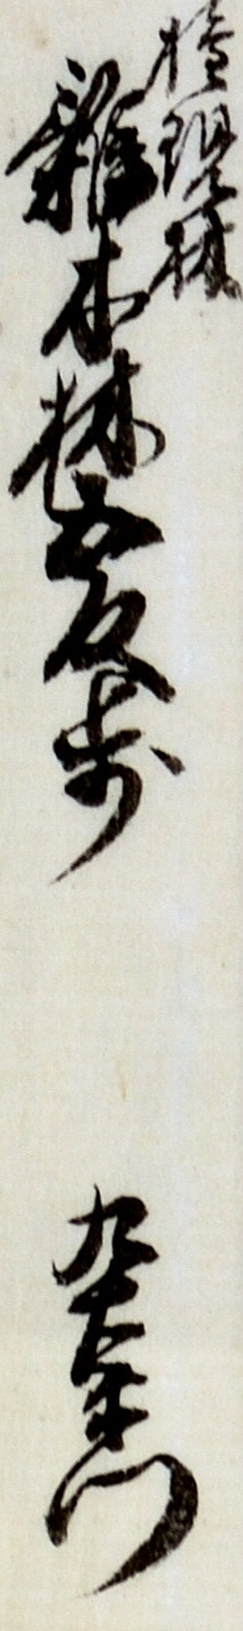雑木林五反歩九右衛門
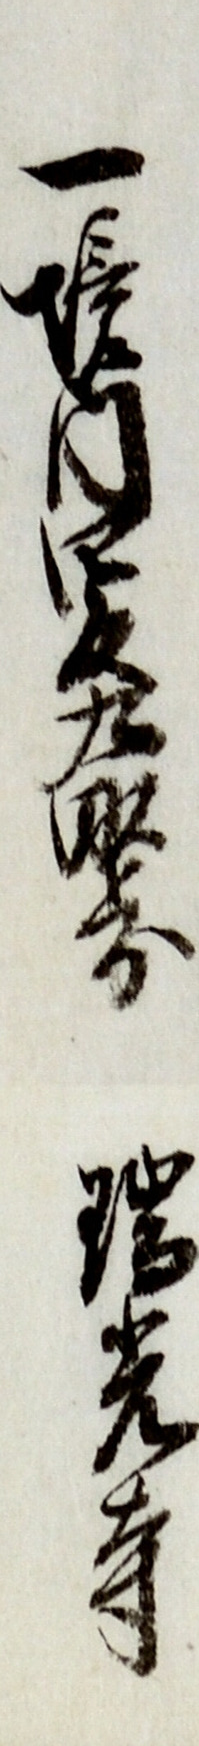一境内四反九畝歩瑞光寺
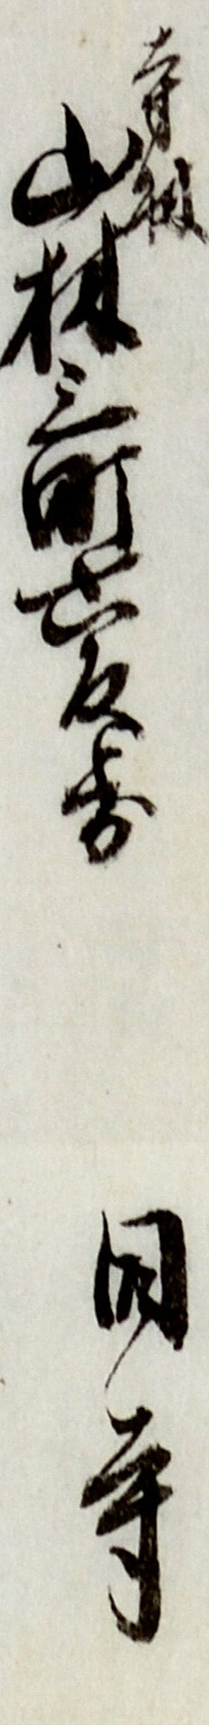山林三町六反歩同寺
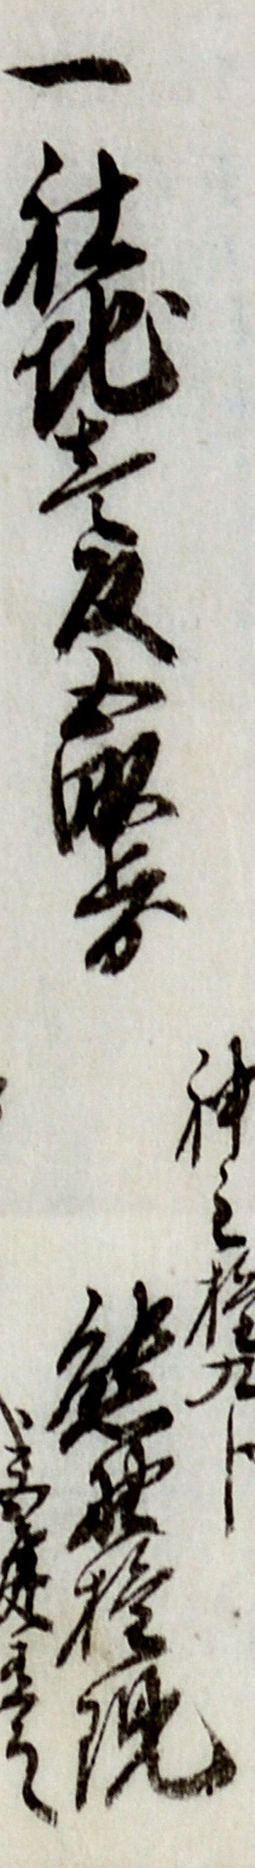一社地壱反五畝歩熊野権現
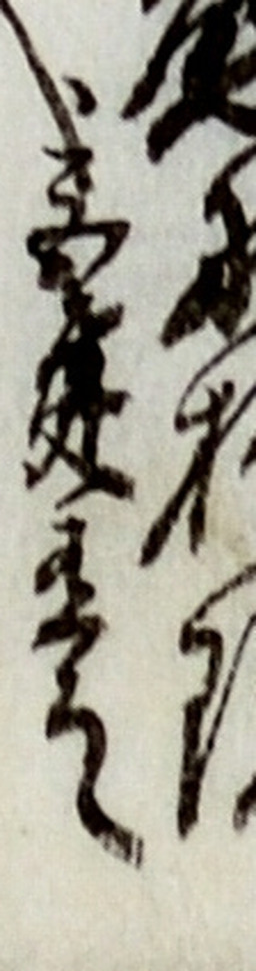宮建有之
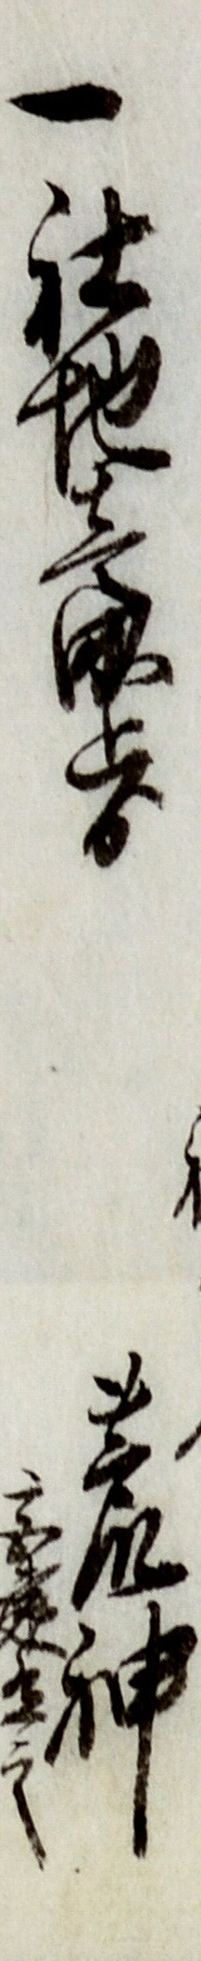一社地壱畝歩荒神
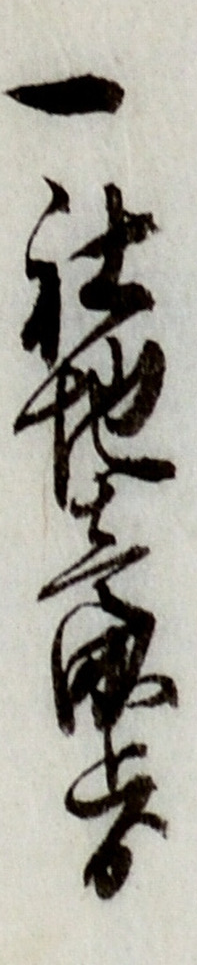一社地壱畝歩荒神
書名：御領分中山林社地手控
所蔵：伊那市立高遠町図書館・合同会社AMANE
